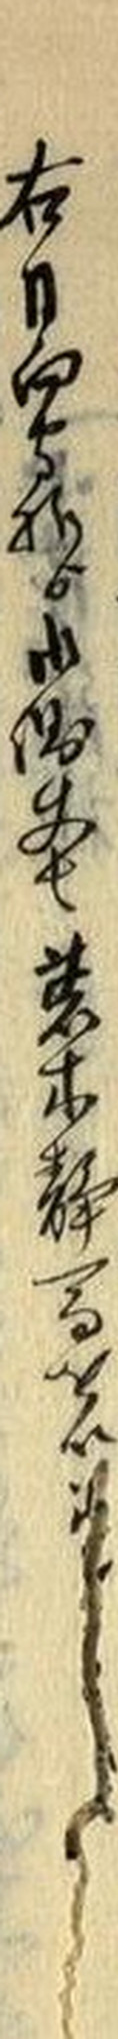右日向守様ゟ御使者荒木静馬を以被進之
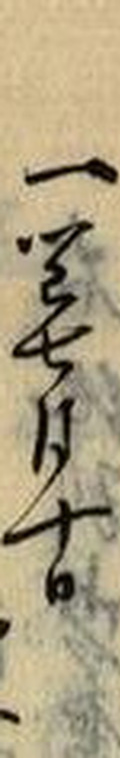一閏七月十日
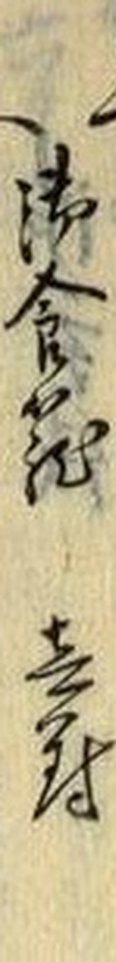御食籠壱対
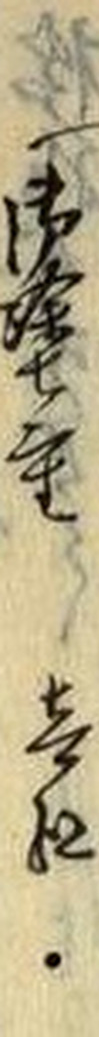御塗重壱組
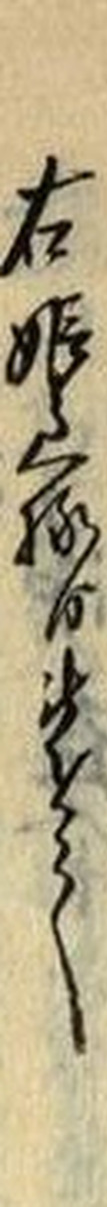右姫君様ゟ被進之
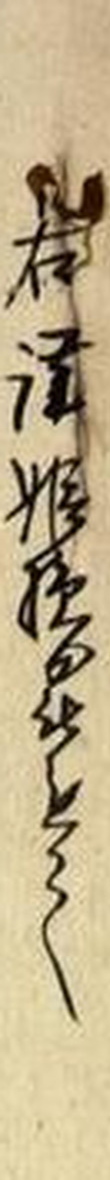右謹姫様ゟ被進之
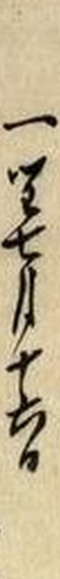一閏七月十六日
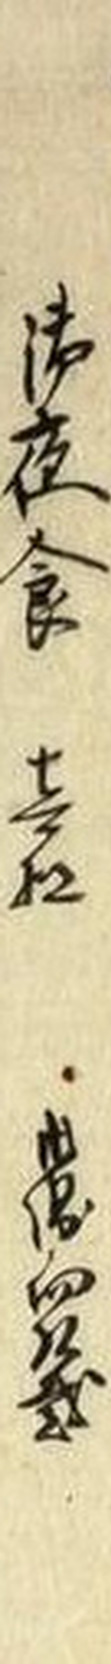御夜食壱組御側向頂戴
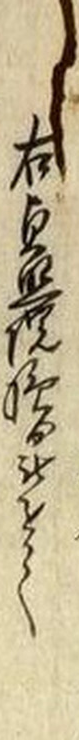右貞照院様ゟ被進之
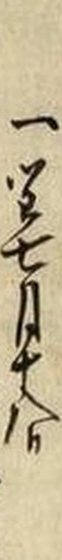一閏七月十八日
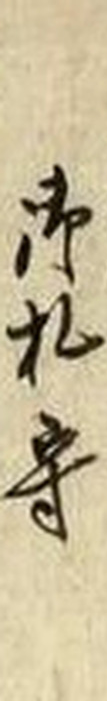御札守
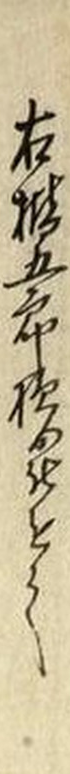右楷五郎様ゟ被進之

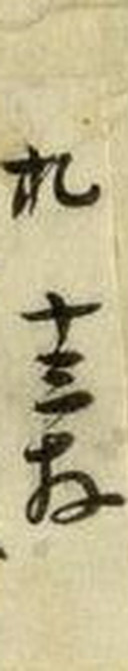札十三枚
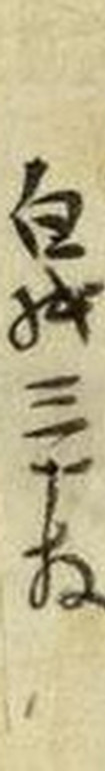白紙三十枚
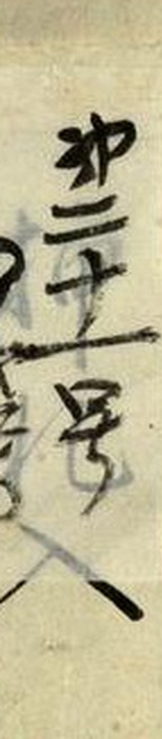第二十一号
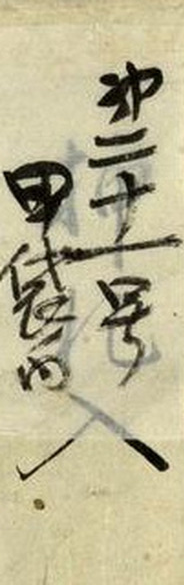第二十一号
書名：少傅日録抄（斉承付側向頭取日記、在府）
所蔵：福井県文書館 Fukui Prefectural Archives
